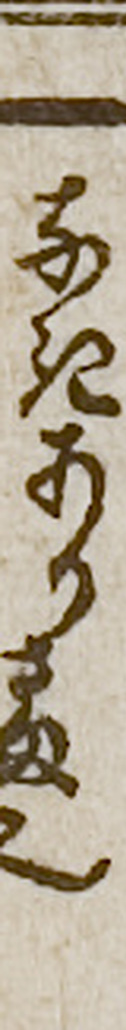なきありさま也
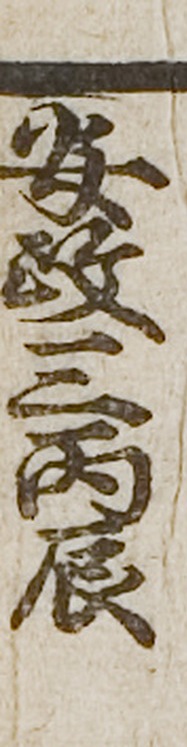安政三丙辰
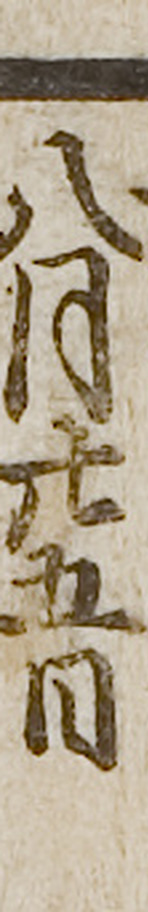八月廿五日
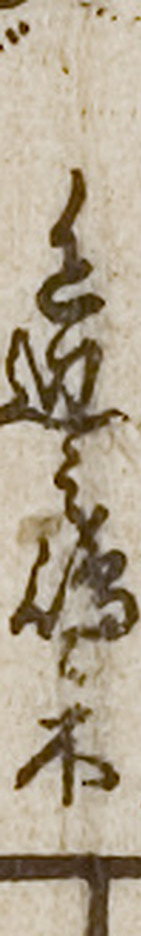近辺の嶋々不
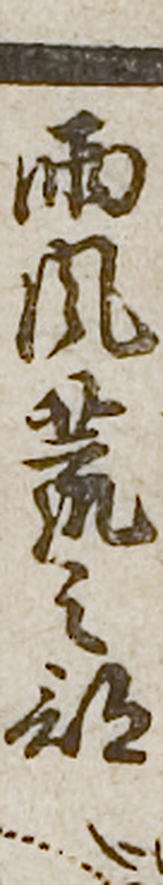雨風荒之郡
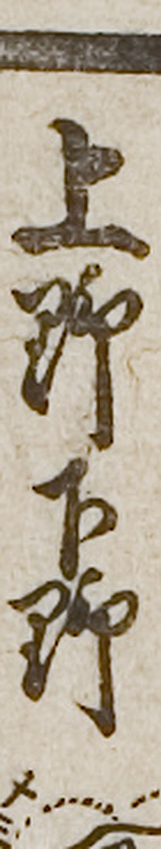上野下野
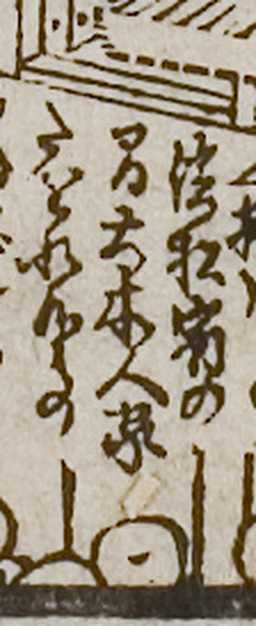間大木人家
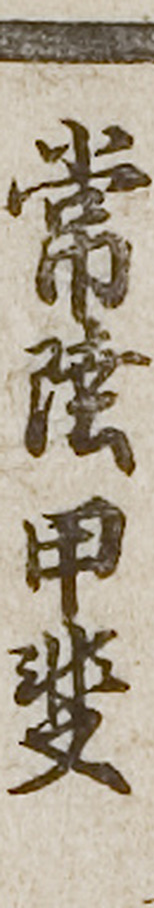常陸甲斐
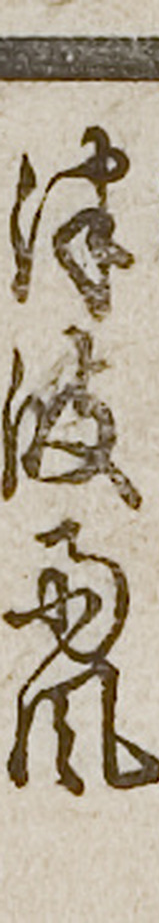津波雨風
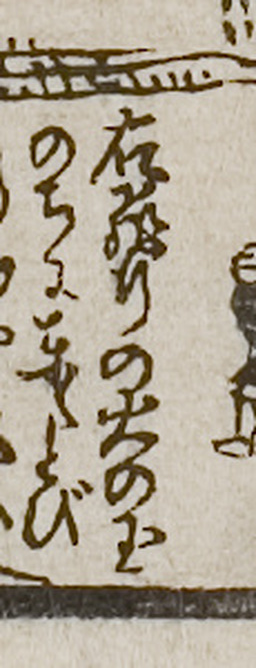右飛行の火の玉
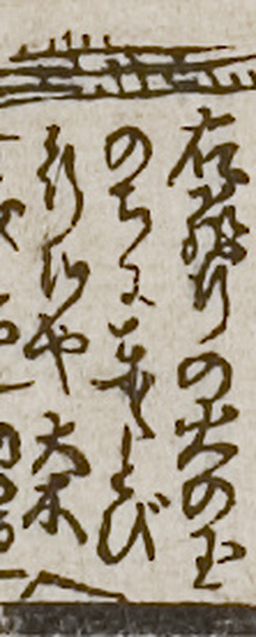のちに早くとび
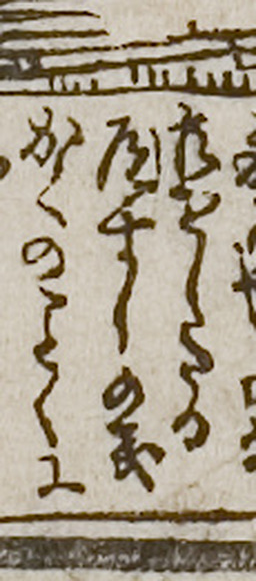道すしの義
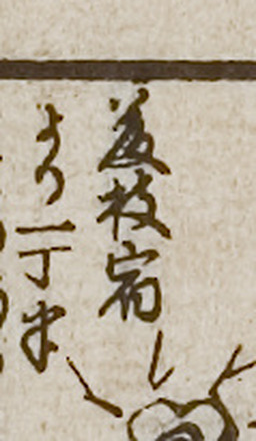藤枝宿
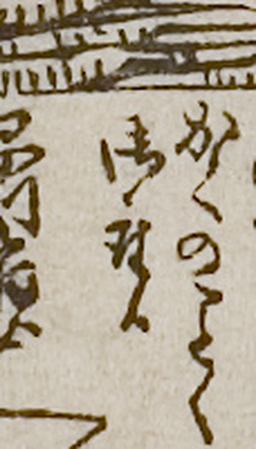御座候
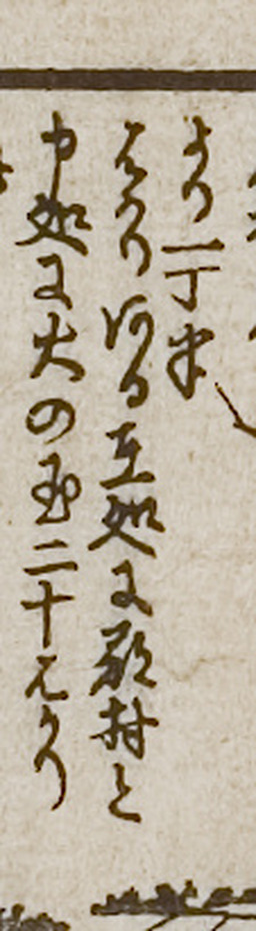はかりある在処に郡村と
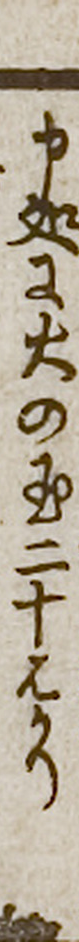申処に火の玉二十はかり
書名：江戸東海道東国荒珍事図
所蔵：東京大学総合図書館 General Library in the University of Tokyo, JAPAN
